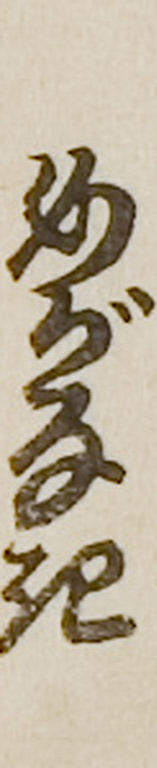めがなき
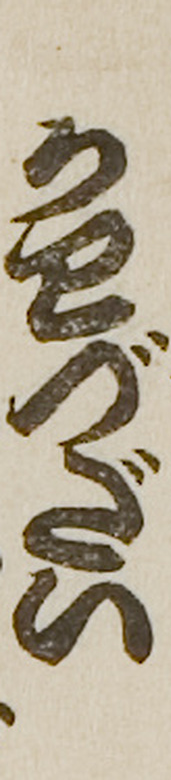かわづだい
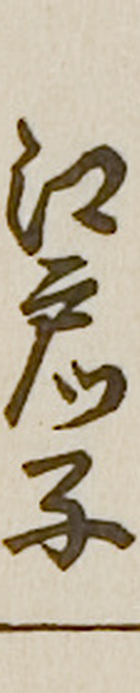江戸ッ子
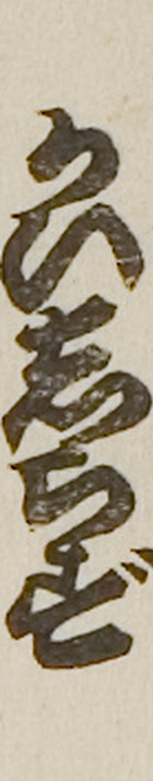かいしらず
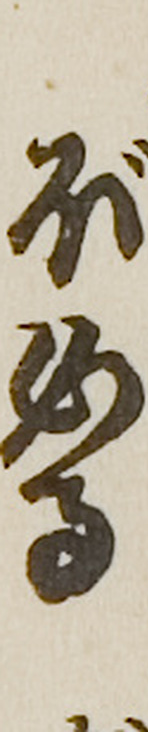ぼめる
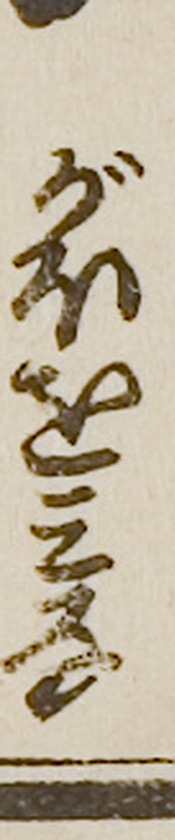がほをみな
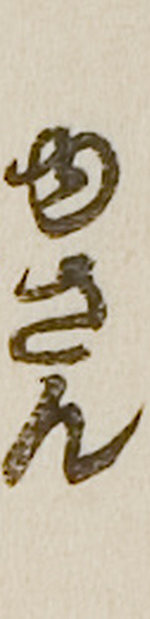ゆさん
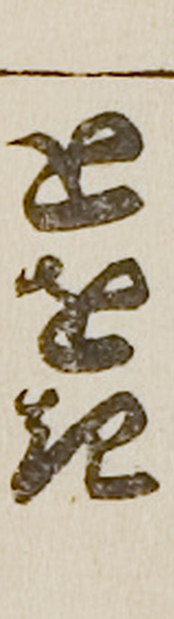とをき
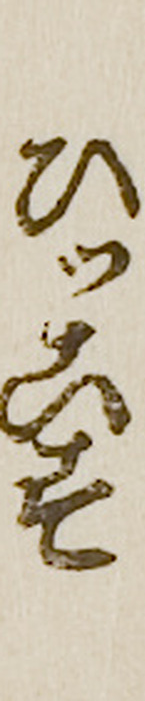ひっこす
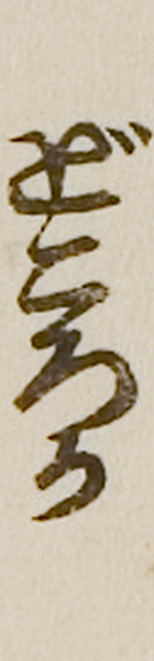どころか
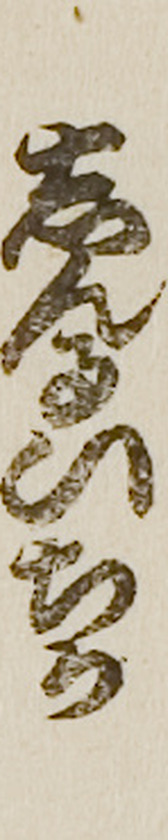しんるいちか
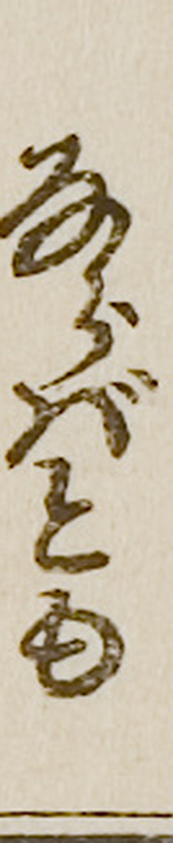ならばとも
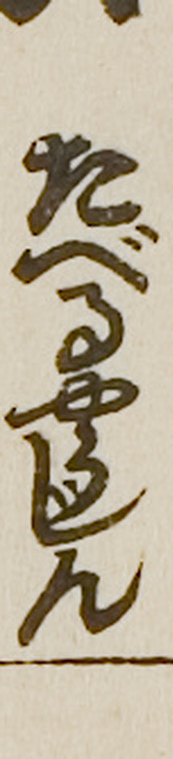たべるやうじん
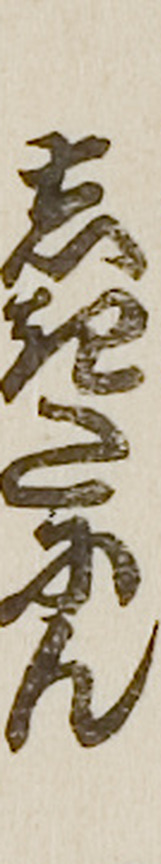しきたにん
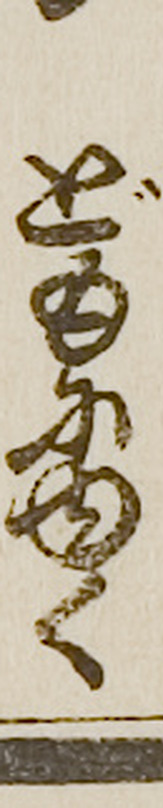どもにゆく
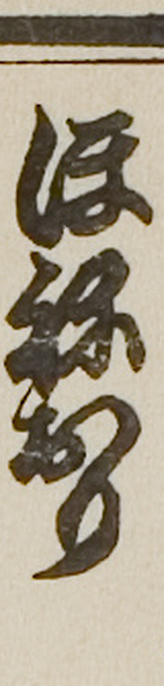ほねおり
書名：当時流行いろは壁
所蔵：東京大学総合図書館 General Library in the University of Tokyo, JAPAN
